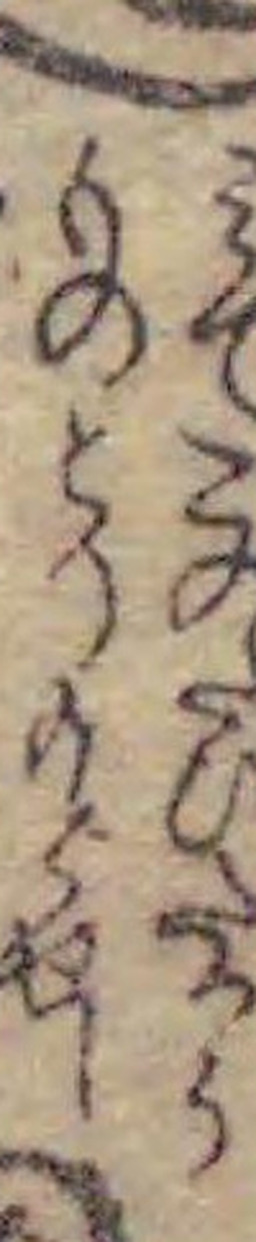ものとりもどせし
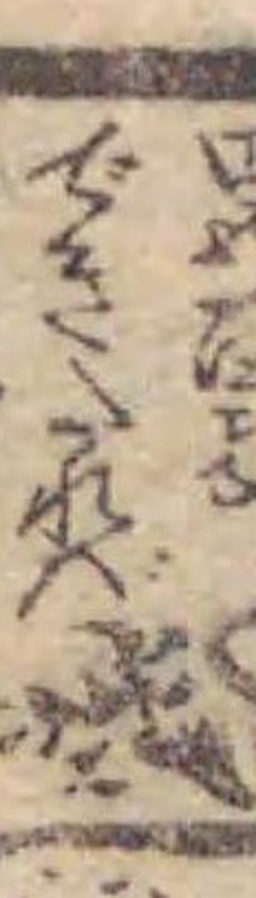できたれば
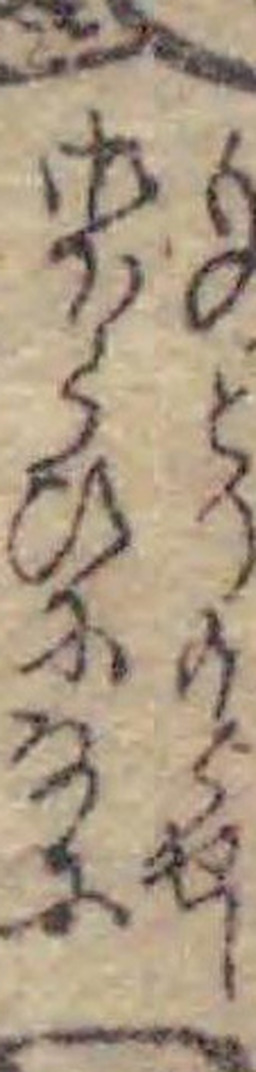御ほうびになに
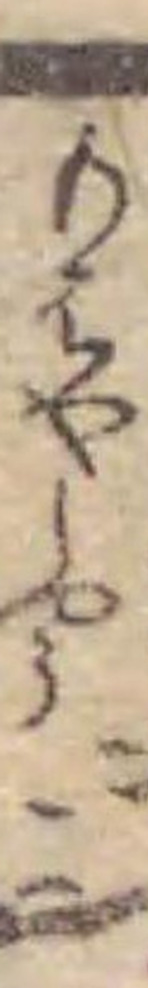もはやしやう
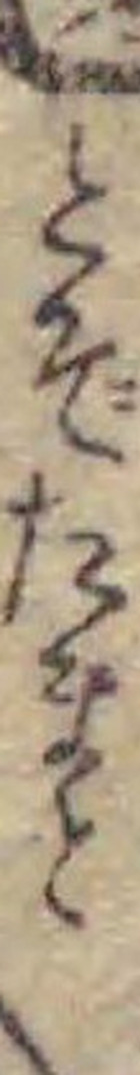とぞたまと
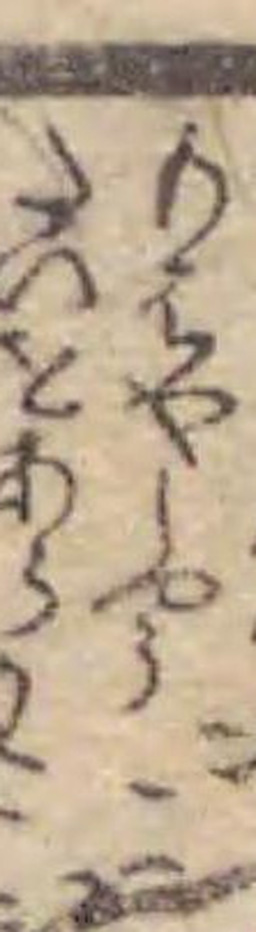たいをあらわし
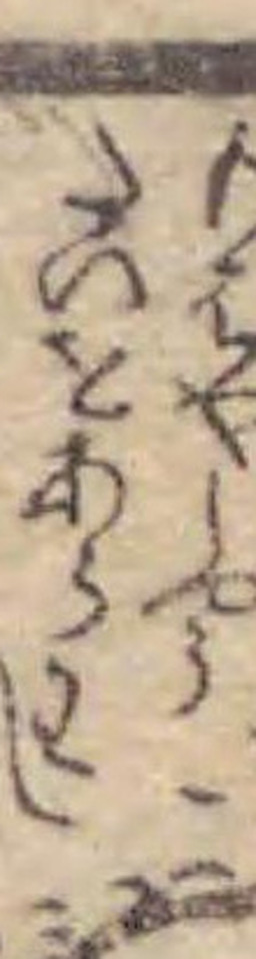たいをあらわし
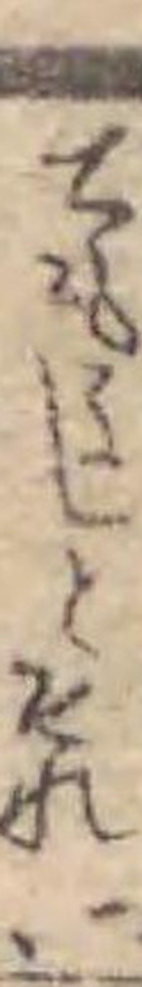てもよしとそれ
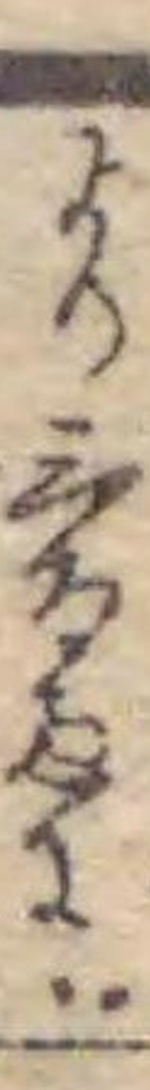より三百両に
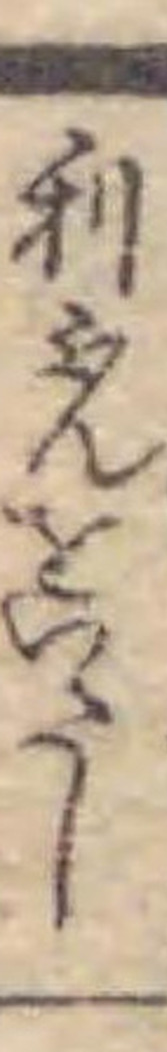利ふんをいたし
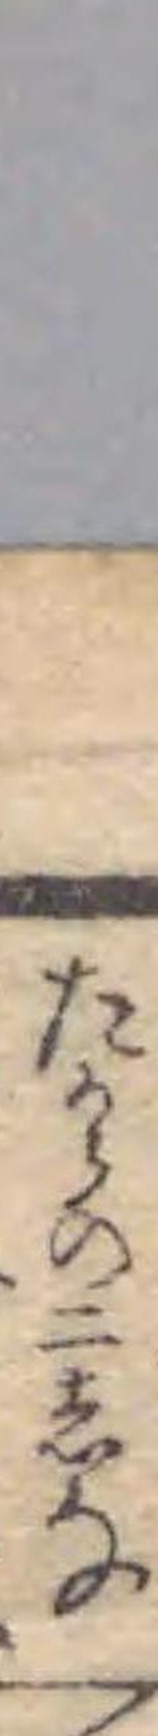たからの二しな
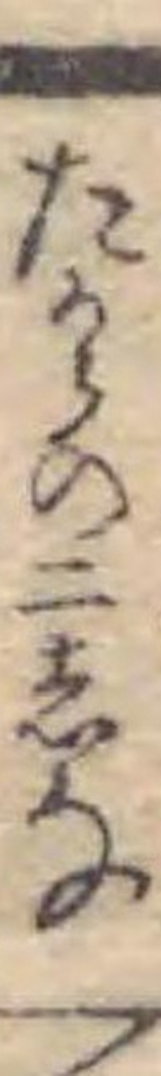たからの二しな
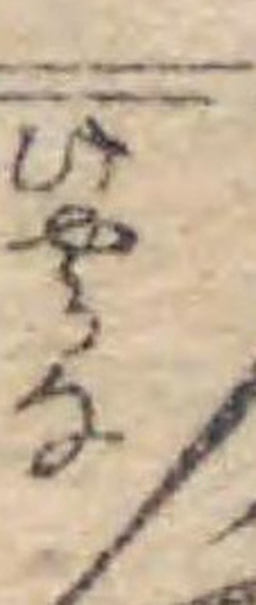此やうな
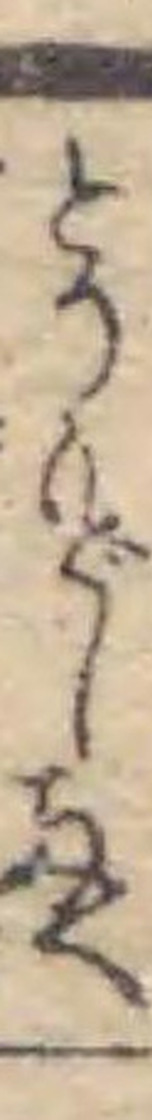とりもどし両人
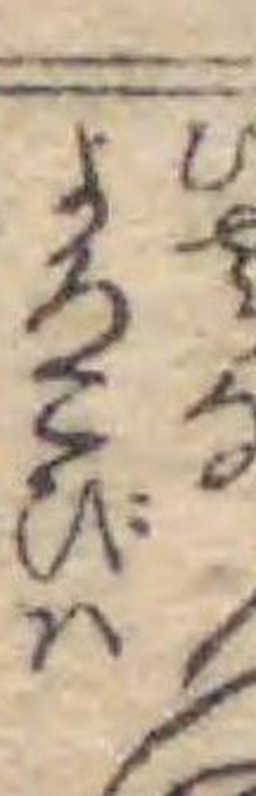よろこびは
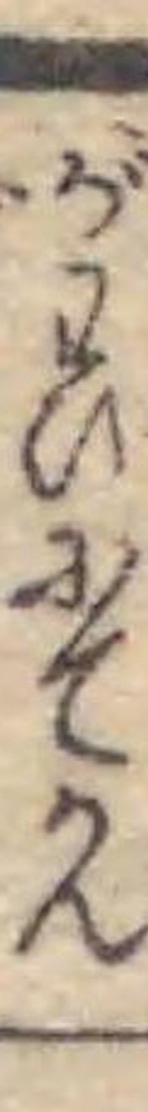がわびにてかん
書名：扨化狐通人 : 2巻
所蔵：国立国会図書館 National Diet Library, JAPAN
